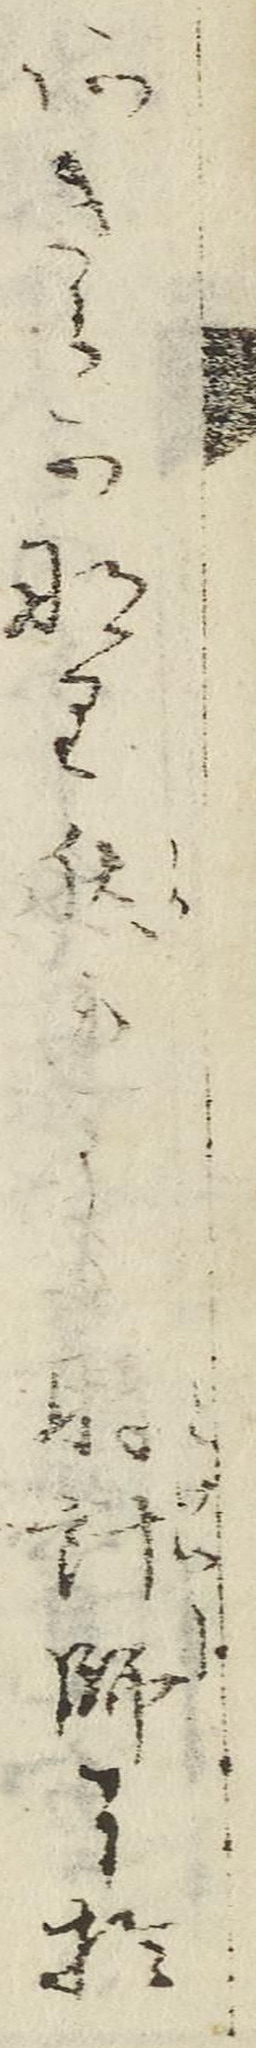あきらかなり然れとも時計師に於
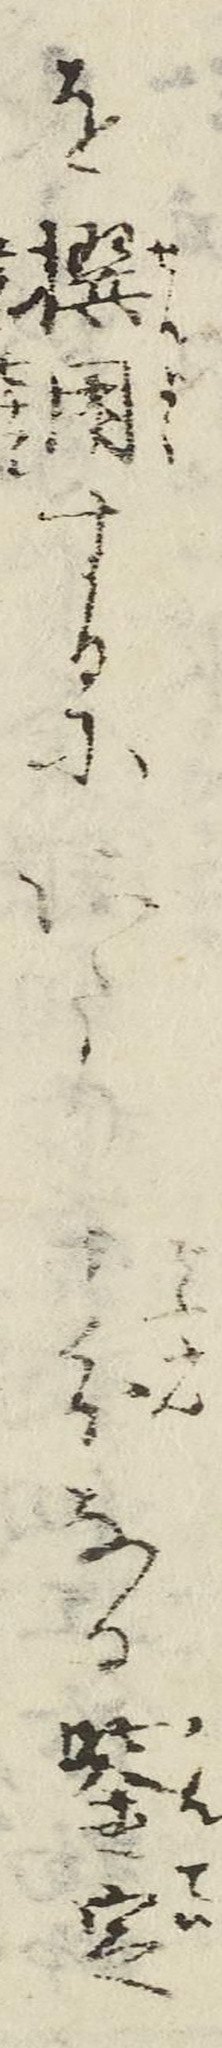を撰用するにあたり十分なる鑑定
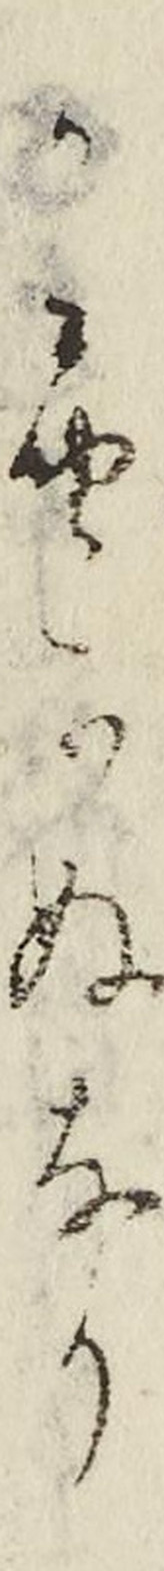か届かぬなり
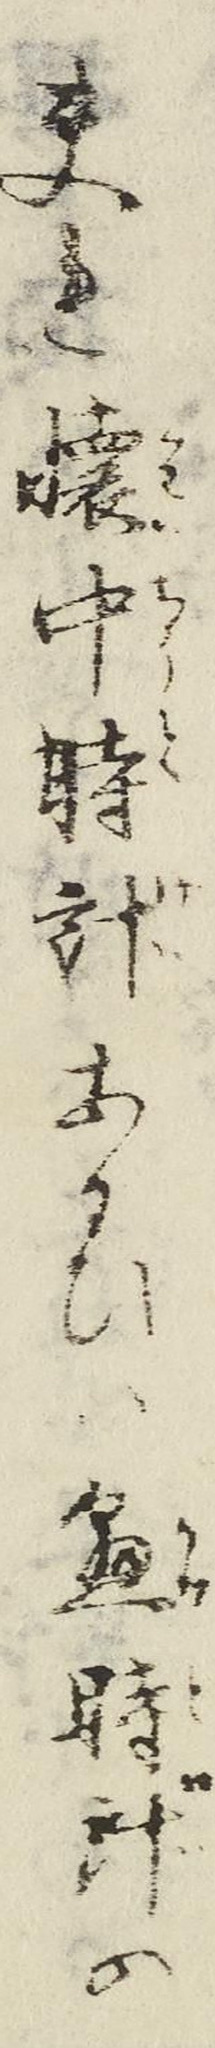夫れ懐中時計あるひは懸時計の
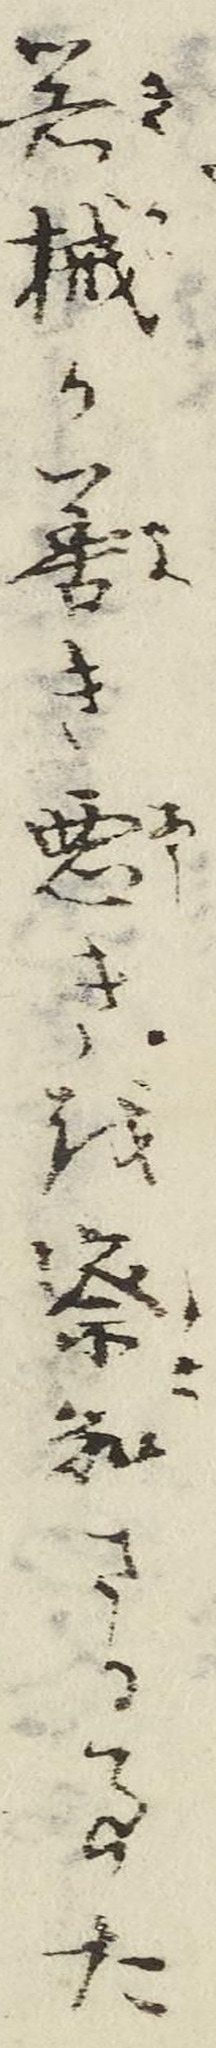器械か善き悪きを察知さる事た
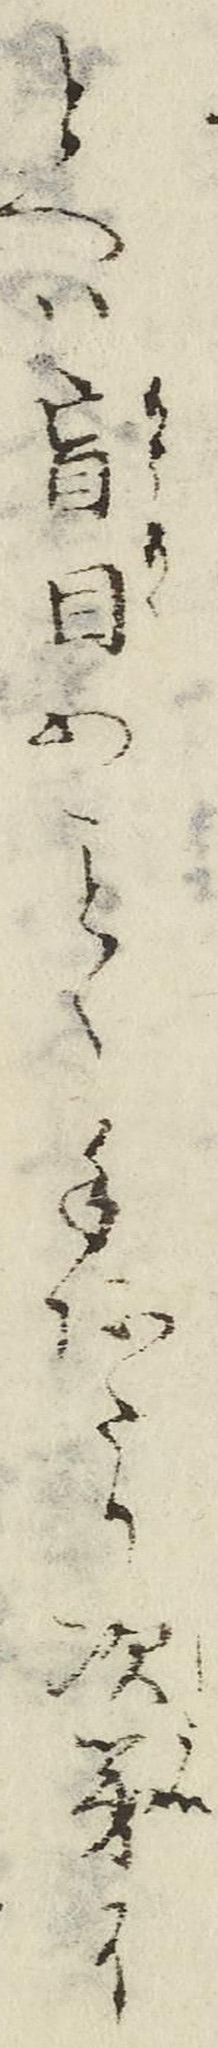とへは盲目のことく手あたり次第に
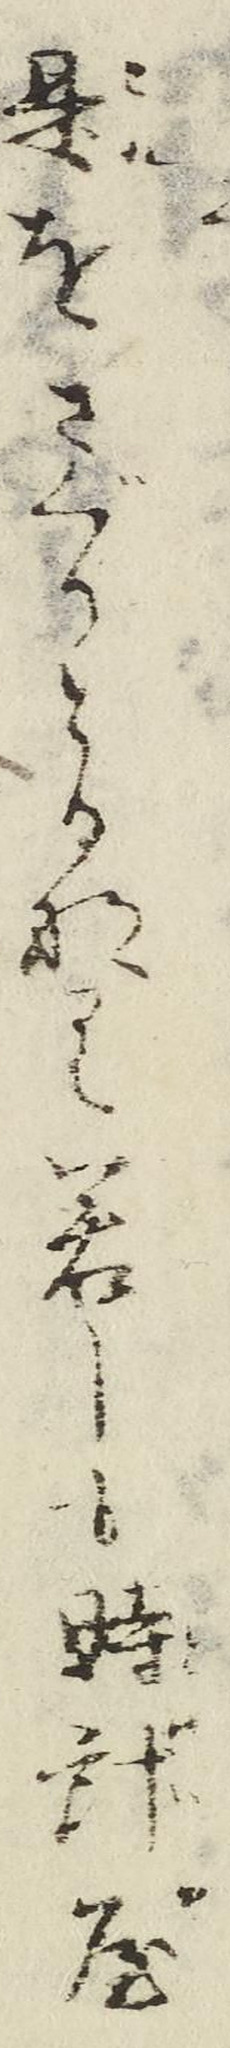是をさぐりとるなり若しも時計屋
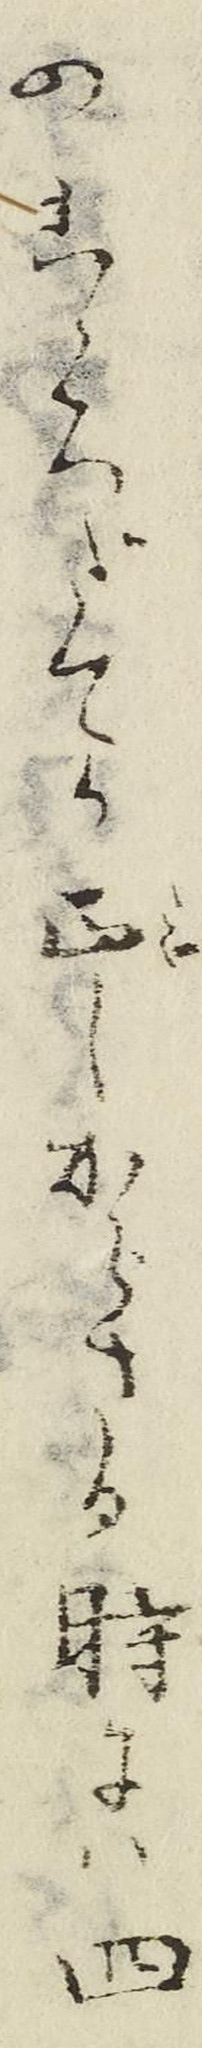のこゝろだてか正しからざる時には四
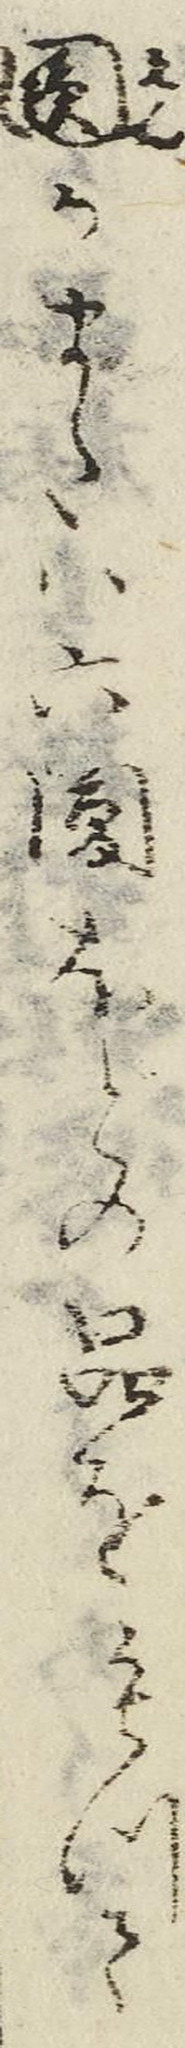円かまたは六円ほとの品をもつて
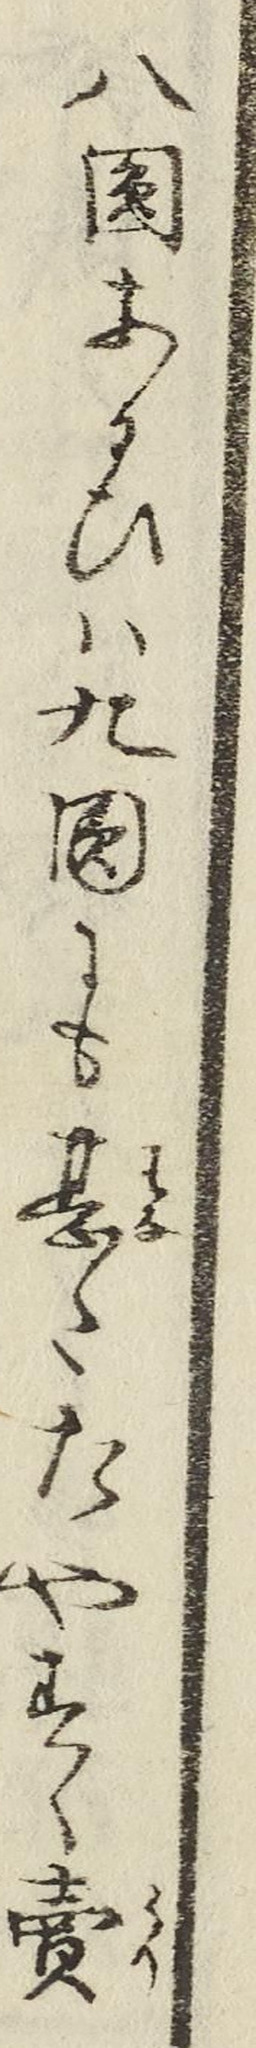八円あるひは九円にも甚〻たやすく売
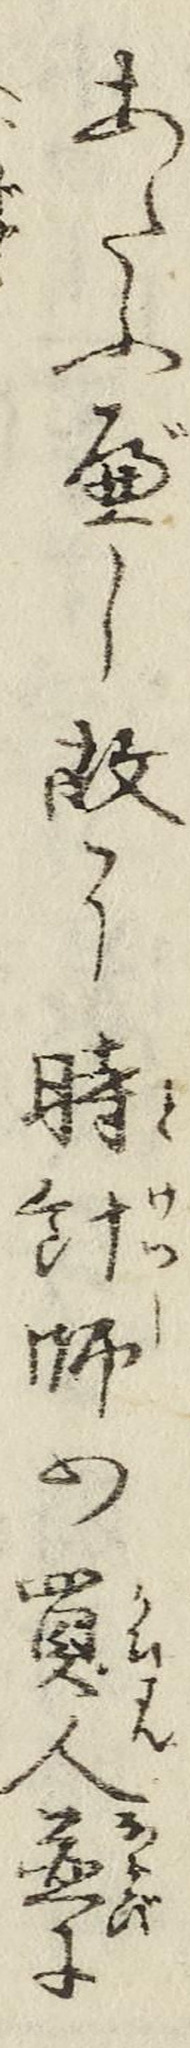あたふべし故に時計師の買人並に
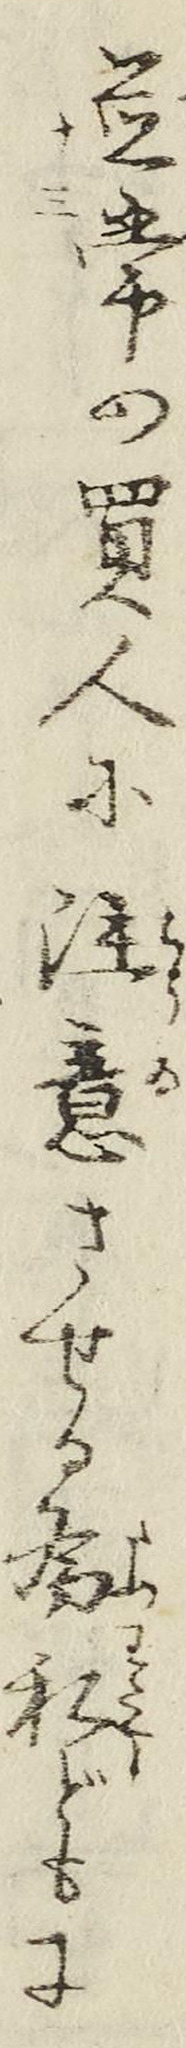並常の買人に注意させる為私どもに
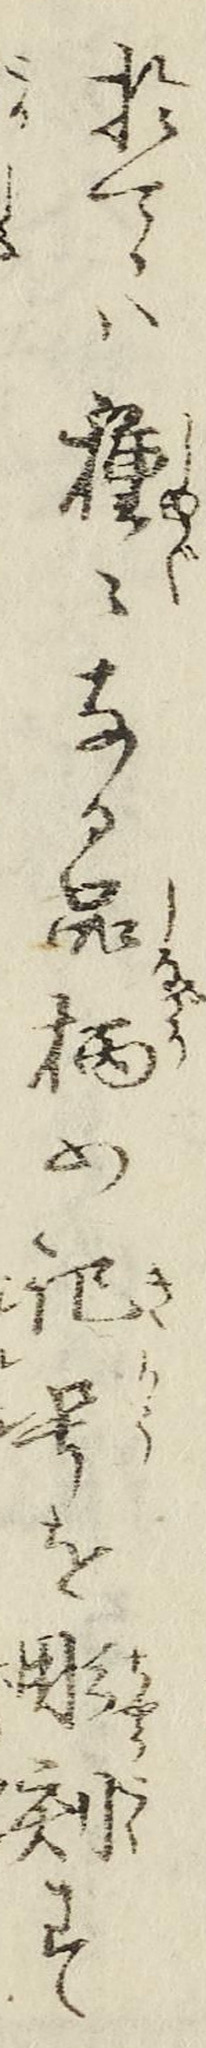於ては種〻なる品柄の記号を彫刻す
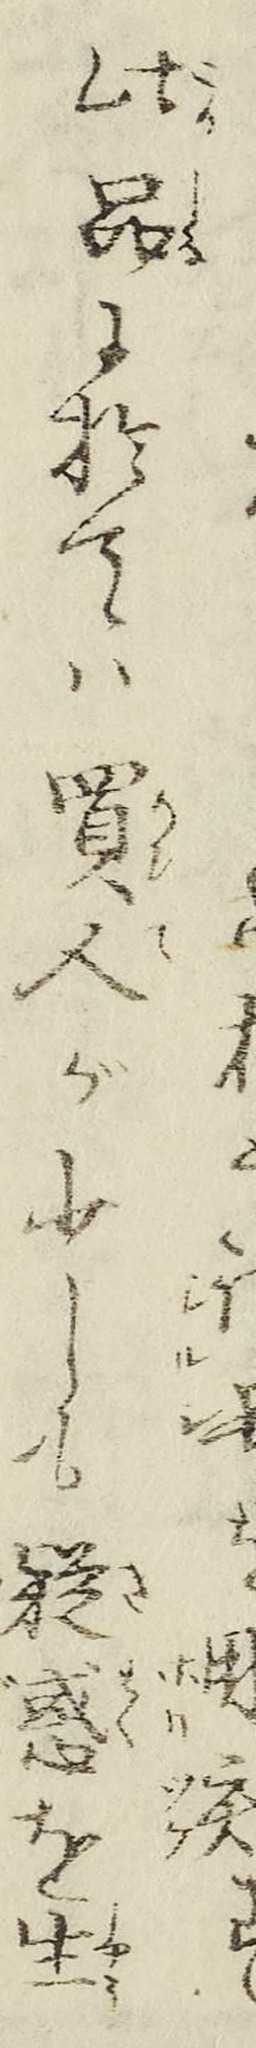此品に於ては買人が少しも疑惑を生
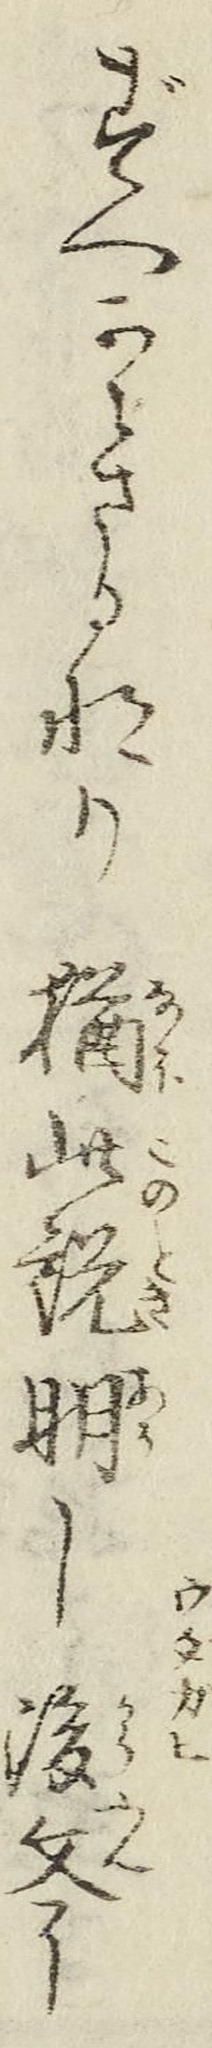ずへからさるなり猶此説明し後文に
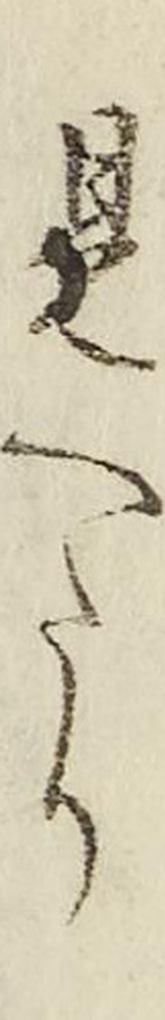見へたり
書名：[時計に関する冊子]
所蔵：東京大学地震研究所図書室 Earthquake Research Institute Library, The University of Tokyo, JAPAN
